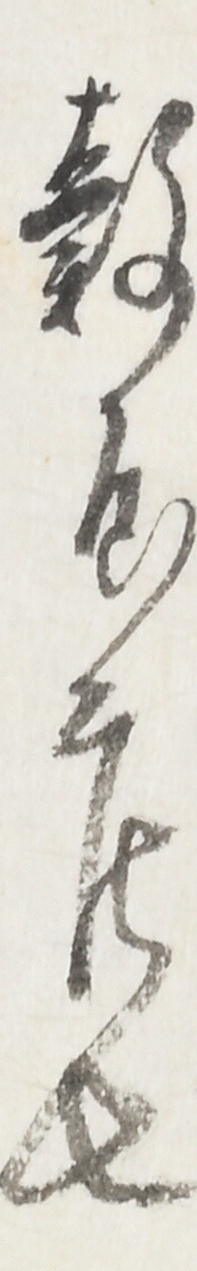穀屋庄七

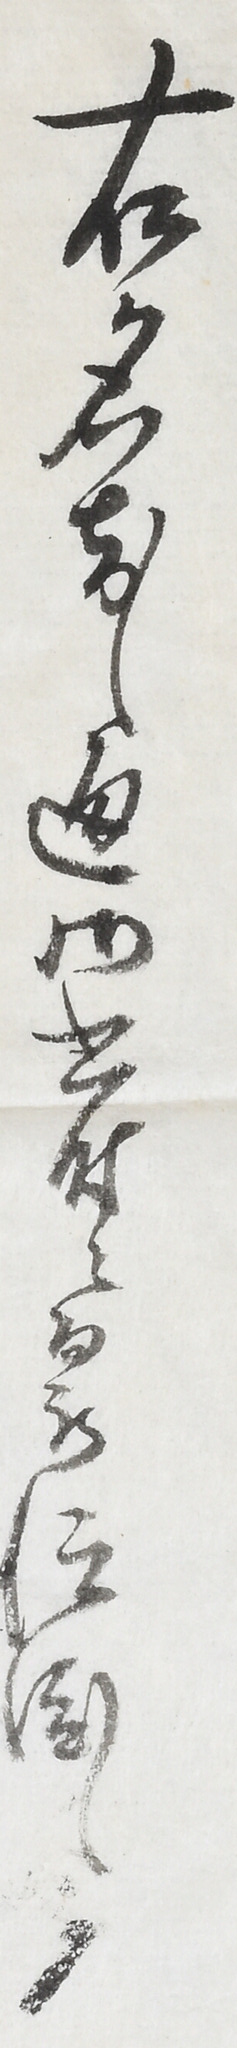右名前之通御書付ニ而被仰渡候
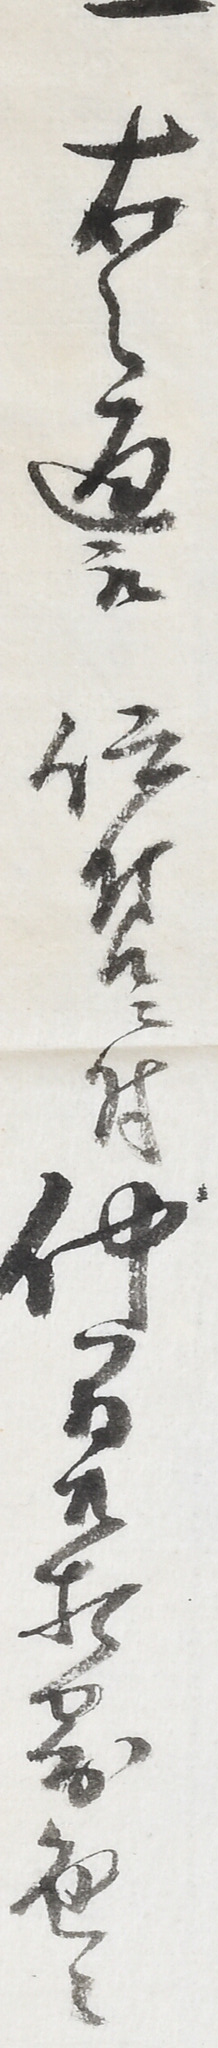一右之通被仰付候ニ付仲間共打寄色々
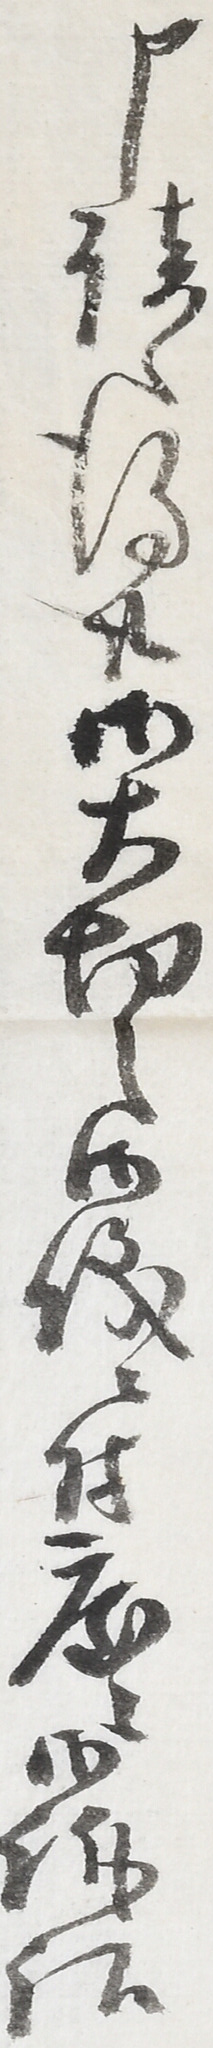申談候得共御大切之御儀ニ付度々御訴訟
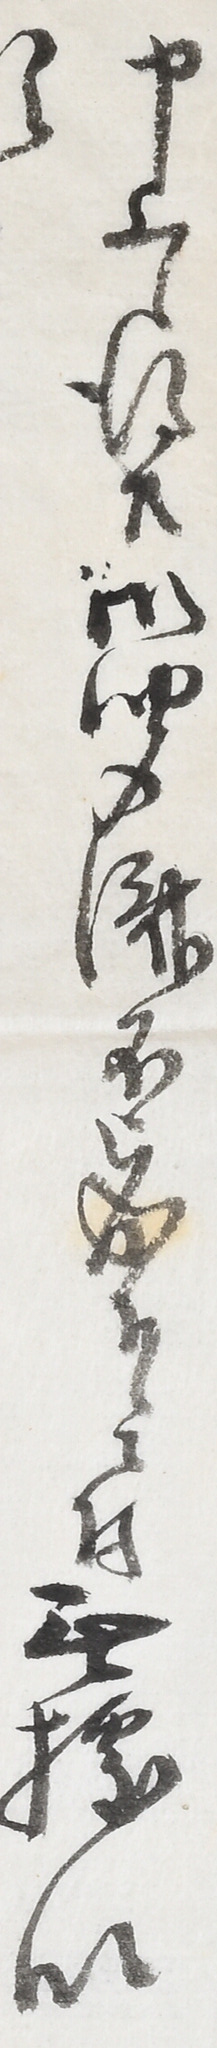申上候得共御聞済不被成下候ニ付無拠以
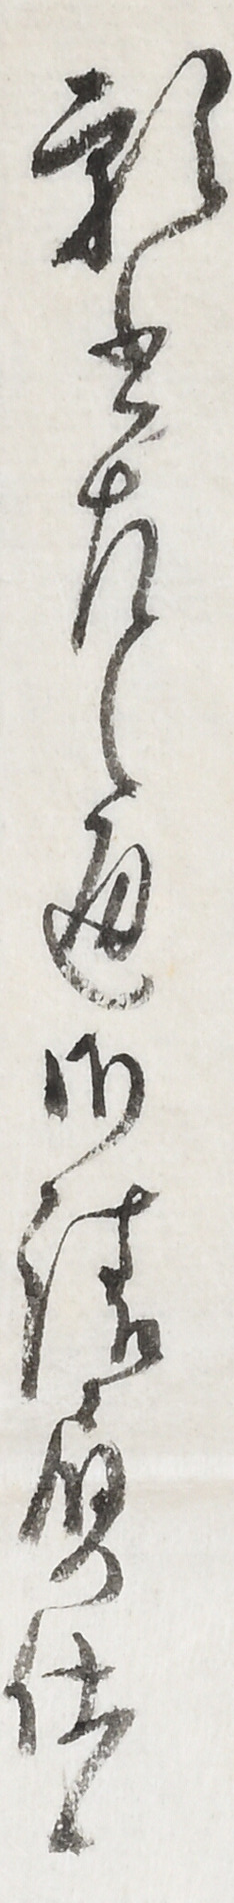願書左之通御請負仕候
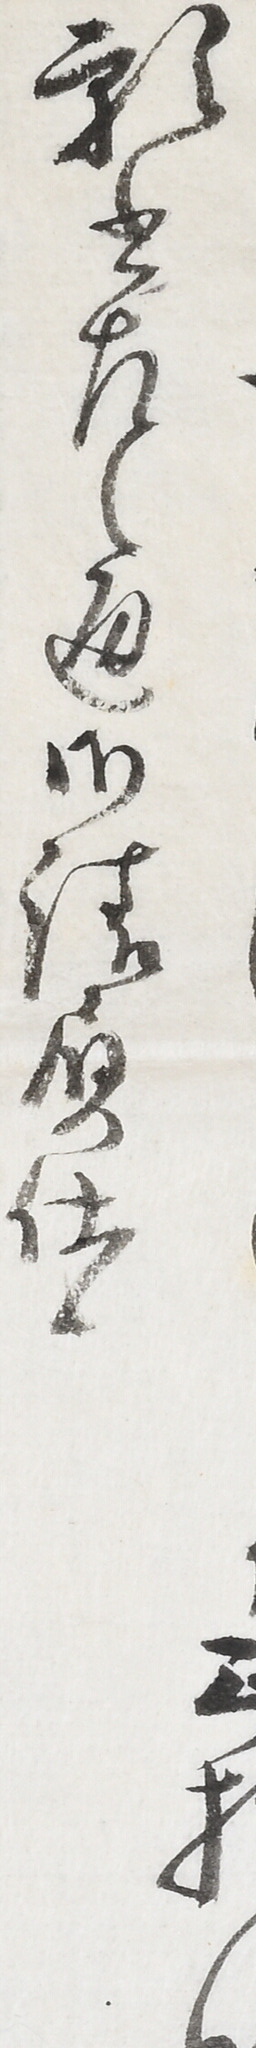願書左之通御請負仕候
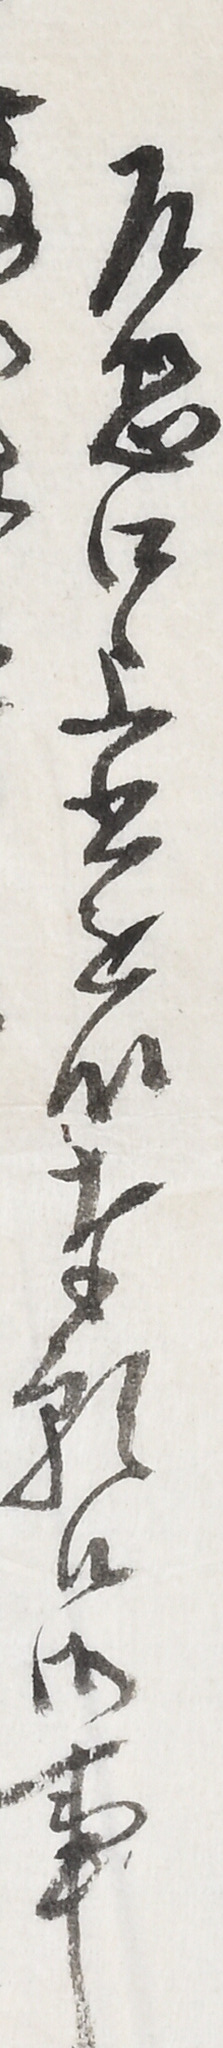乍恐口上書を以奉願候御事
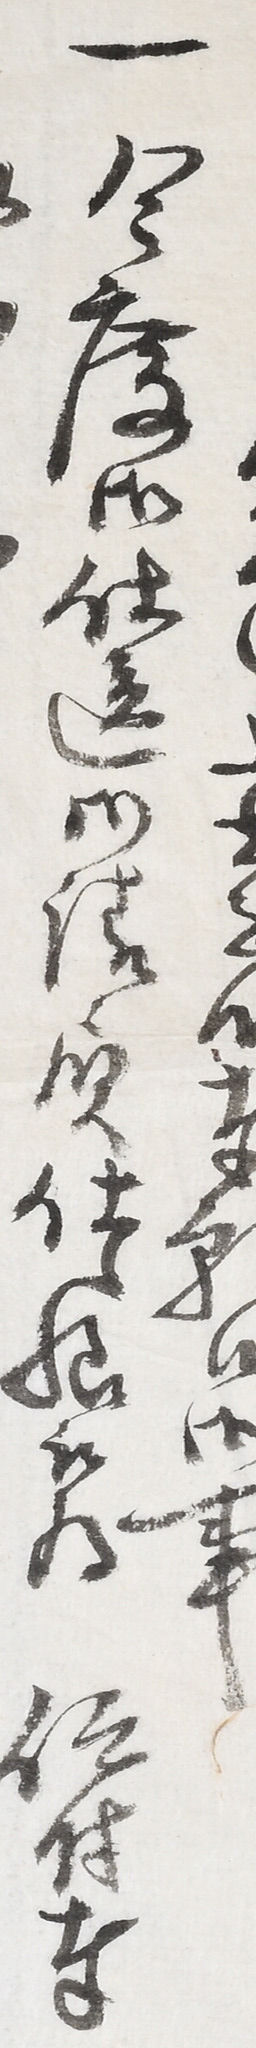一今度御仕送御請負仕候様被為仰付奉
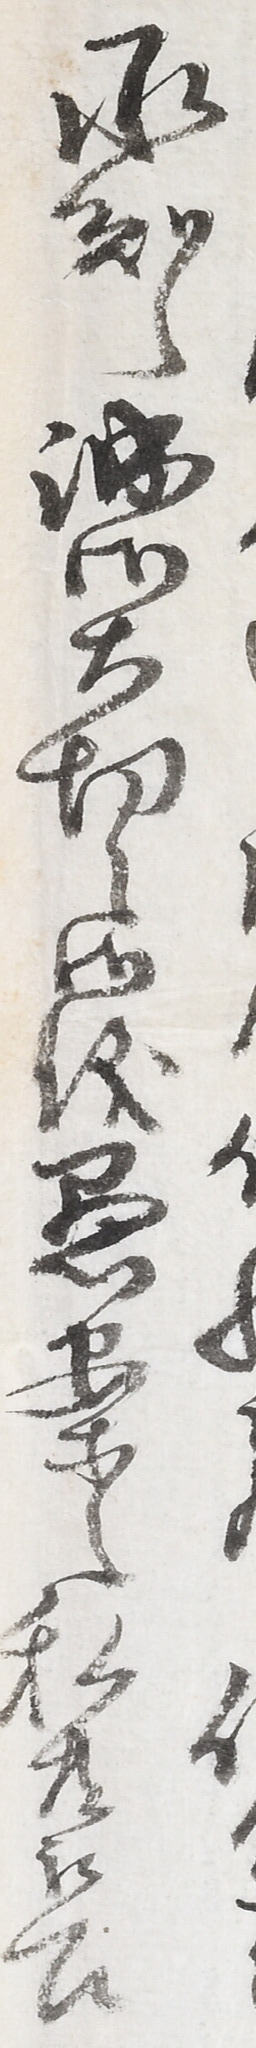承知候誠御大切之御儀愚案之私共被召
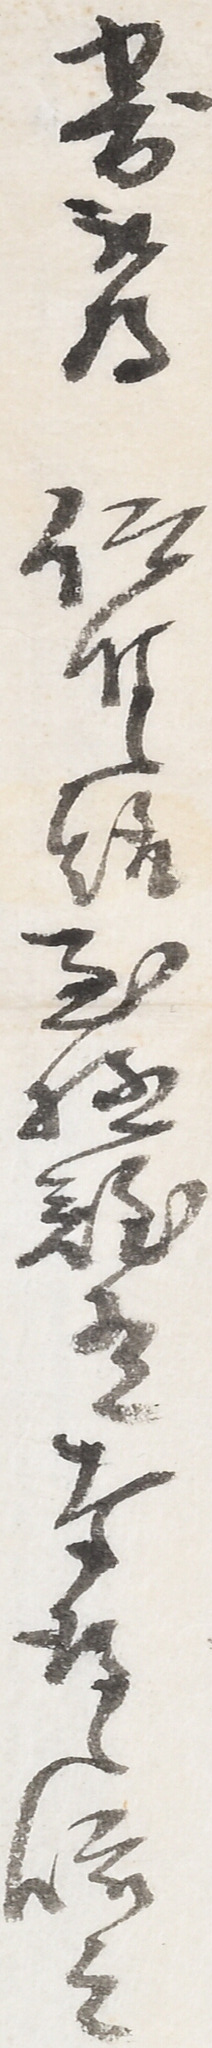寄被為仰付候趣至極難有奉存候依之
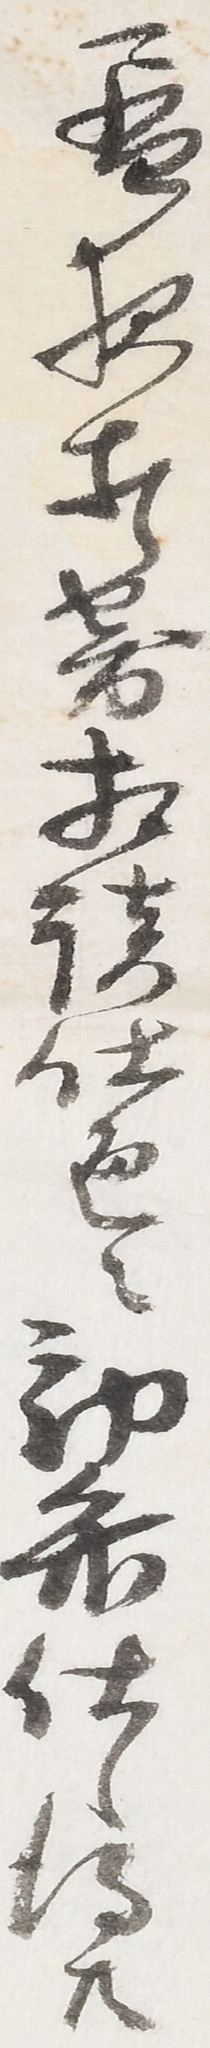昼夜打寄相談仕色々勘弁仕候得共
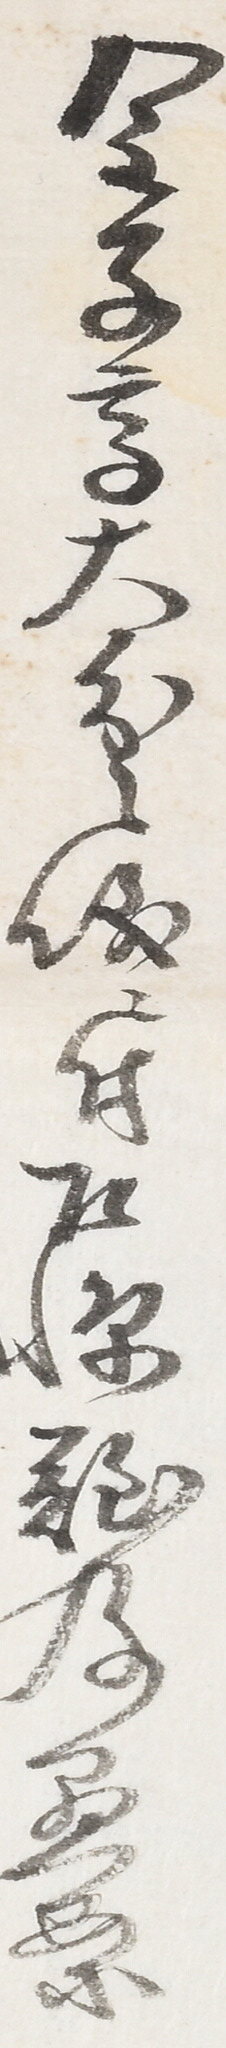金子高大分之儀ニ付乍憚難及愚案
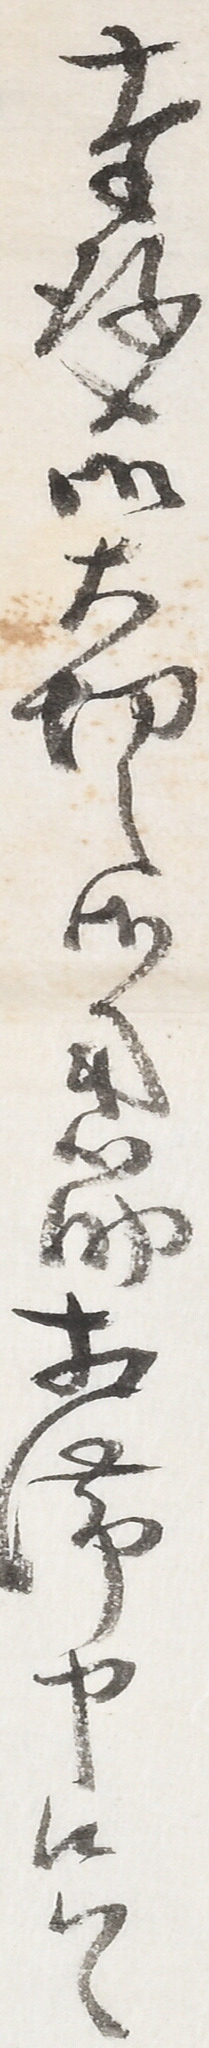奉存候御大切之御用筋相滞申候ハゝ
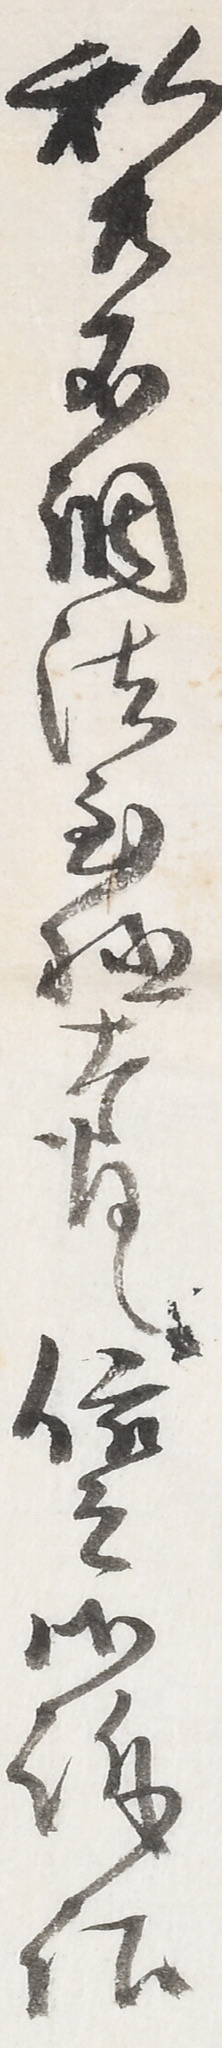私共不調法至極奉存候依之御訴訟
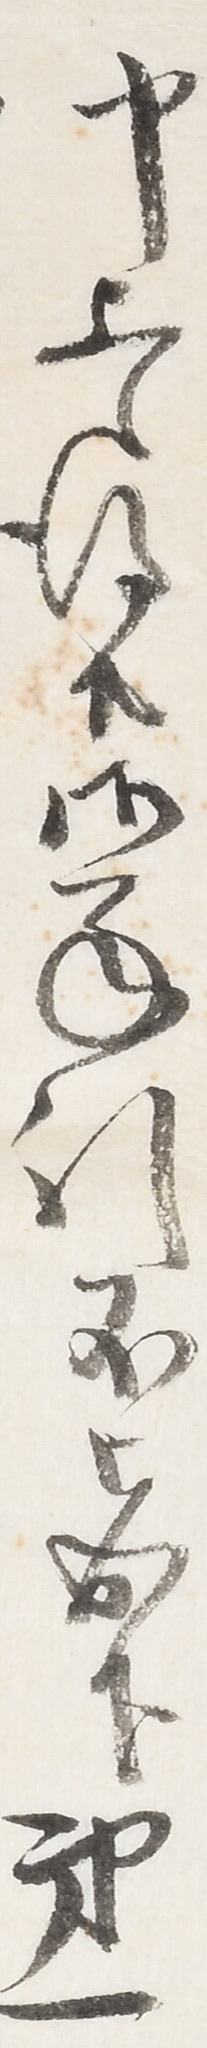申上候得共御承引不被成下第一
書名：覚
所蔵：伊那市立高遠町図書館・合同会社AMANE
